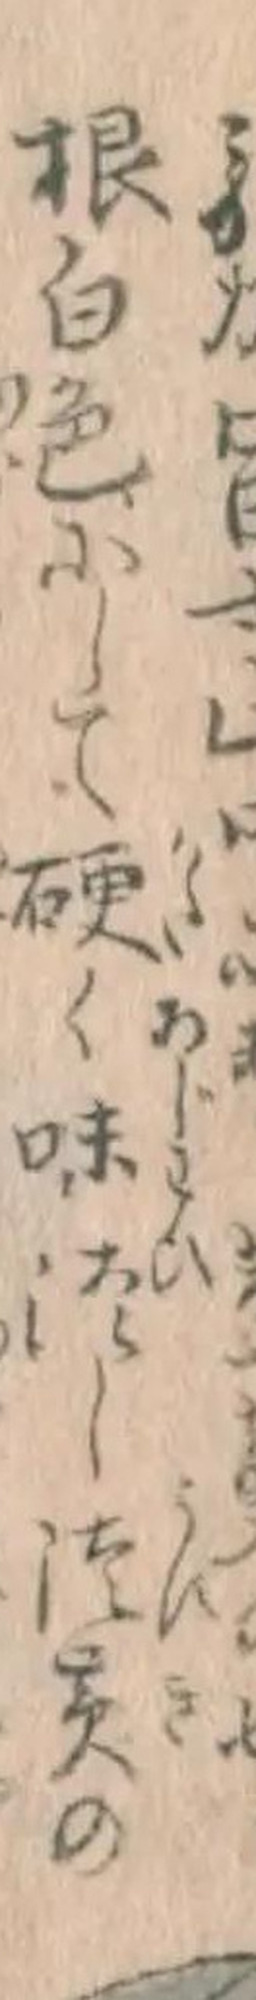根白色にして硬く味深し淡黄の
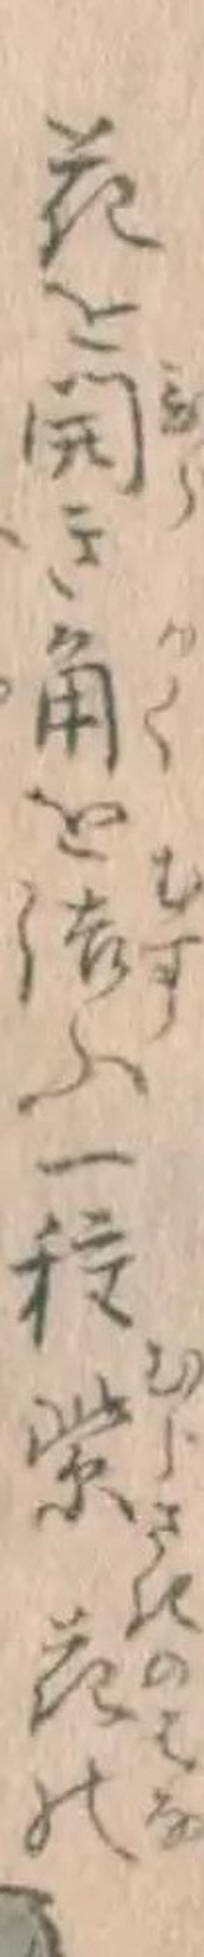花を開き角を結ぶ一種藤花の
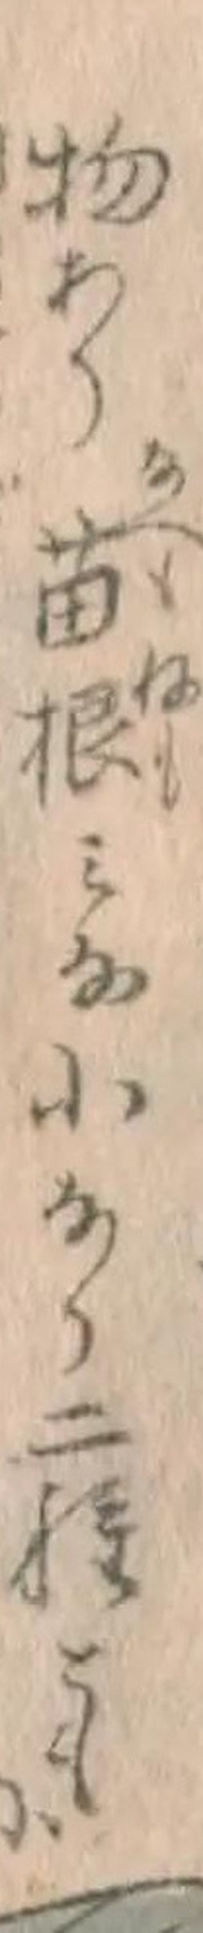物あり苗根みな小なり二種ともに
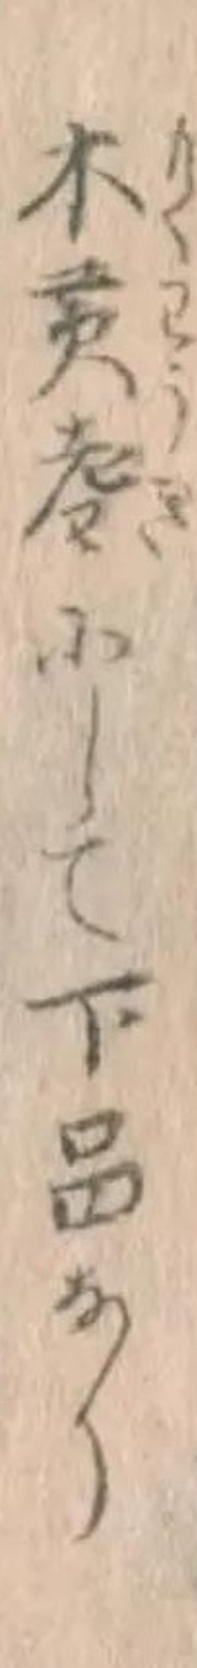木黄耆にして下品なり
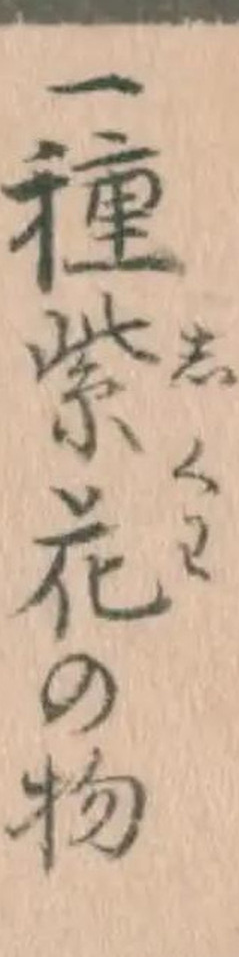一種紫花の物

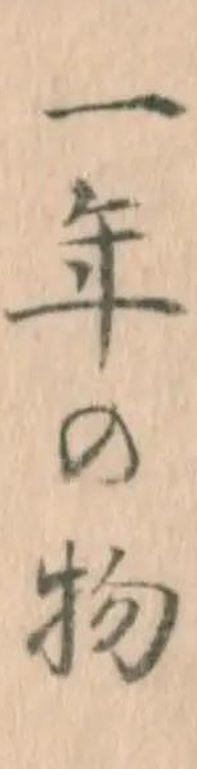一年の物
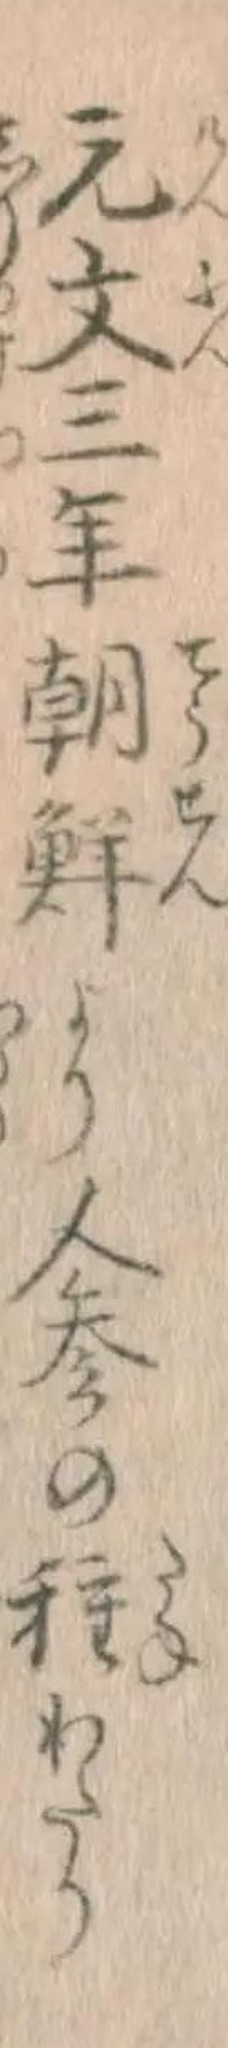元文三年朝鮮より人参の種わたり
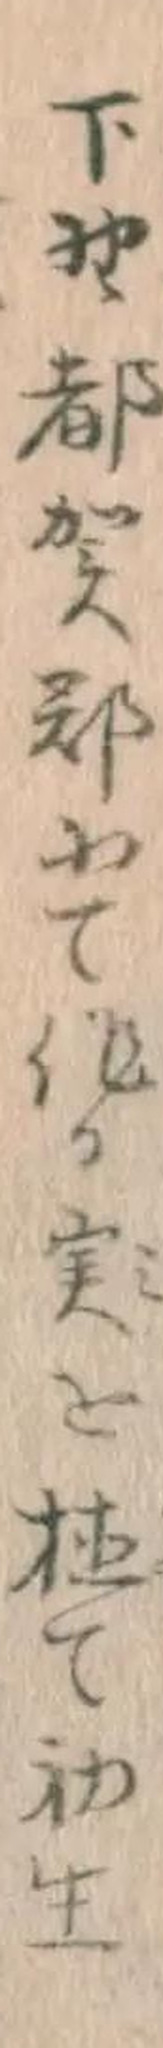下野都賀郡にて作り実を植て初生
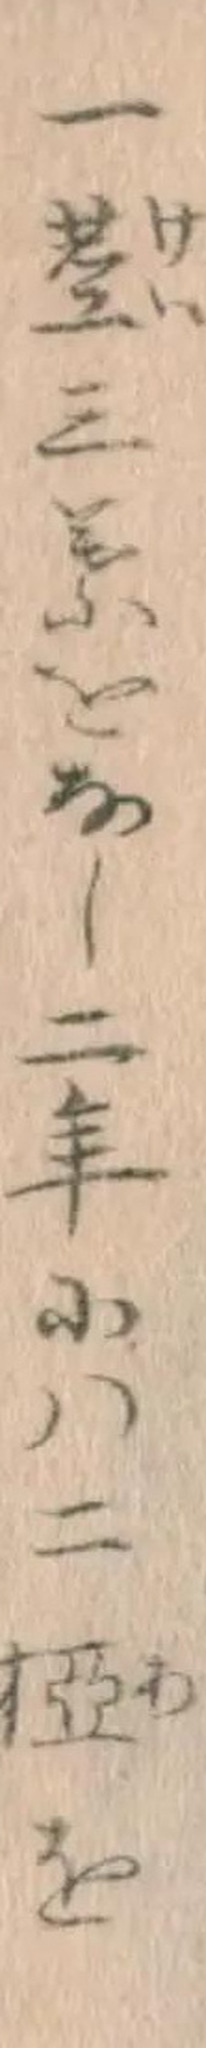一茎三葉をなし二年には二椏を
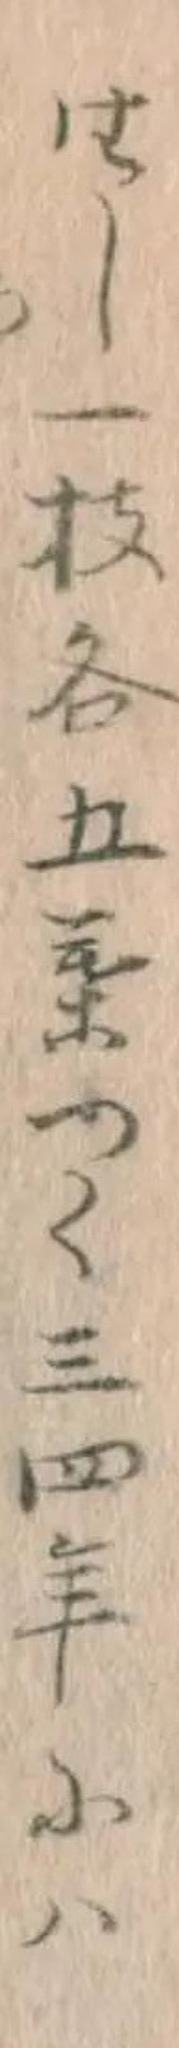生し一枝各五葉つく三四年には
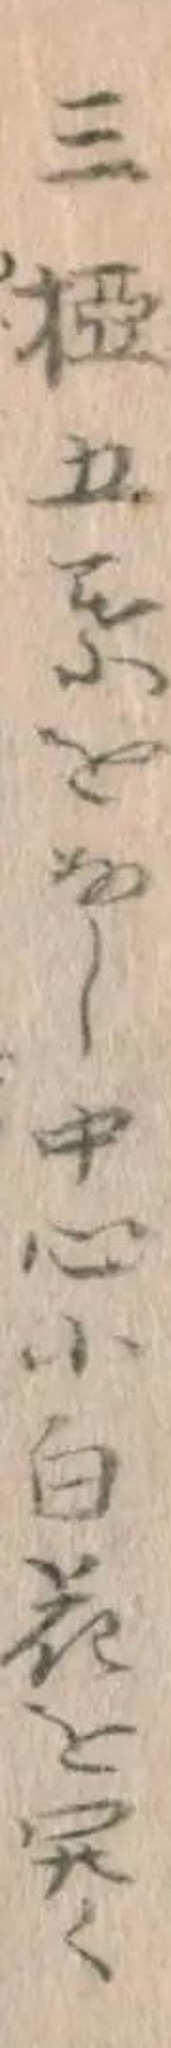三椏五葉をなし中心に白花を開く
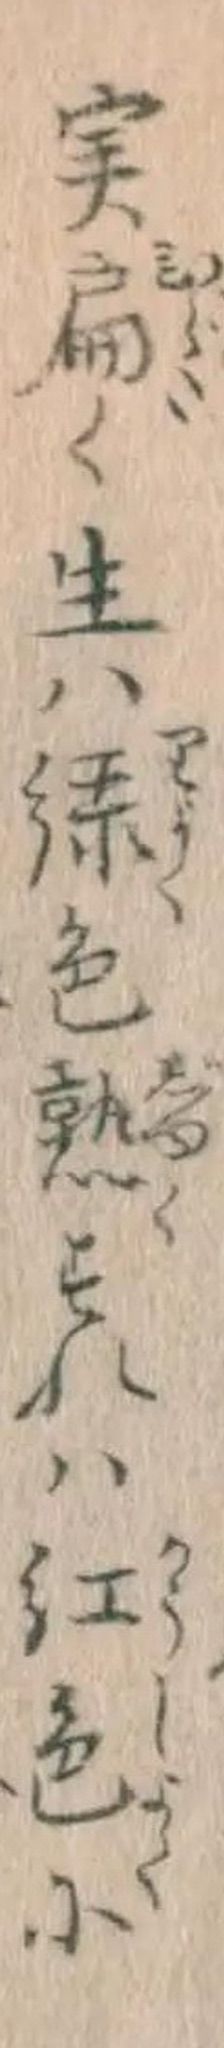実扁く生は緑色熟すれは紅色に
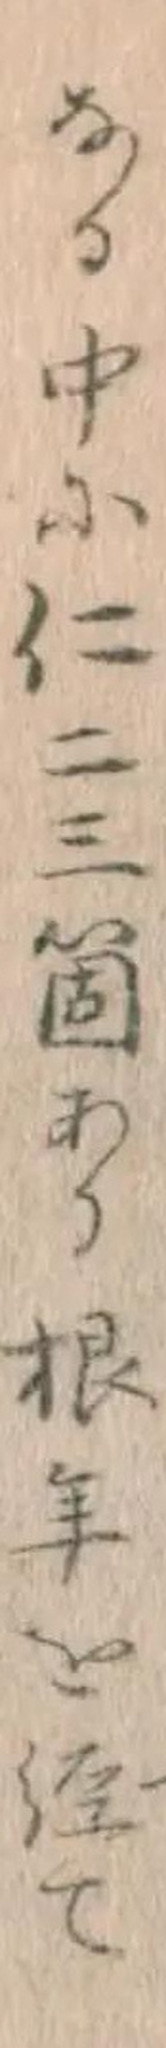なる中に仁二三箇あり根年を経て
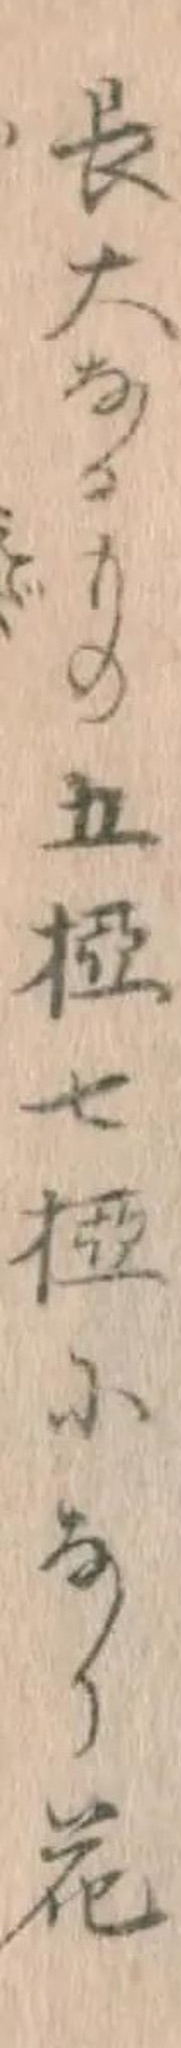長大なるもの五椏七椏になり花
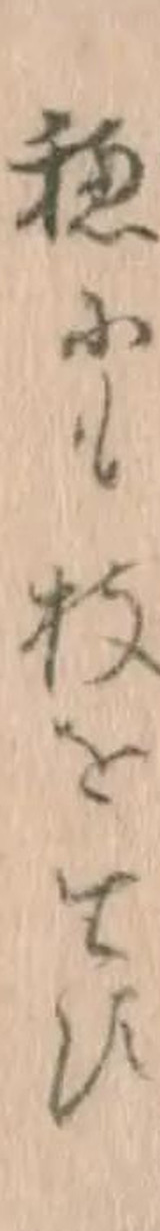穂にも枝を生す
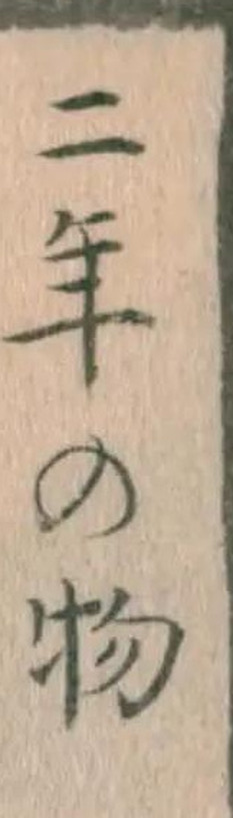二年の物
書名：本草図譜. 巻5-6
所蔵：国立国会図書館 National Diet Library, JAPAN
